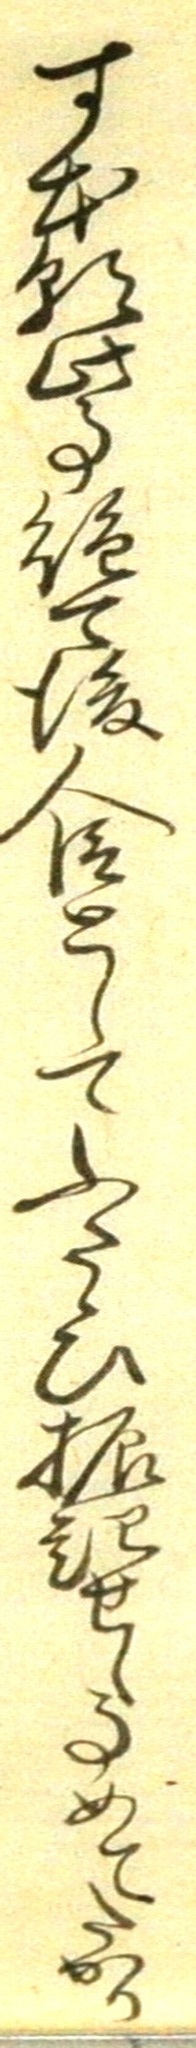す本朝此事絶て後人臣としてふたゝひ振起せし事めてたかり
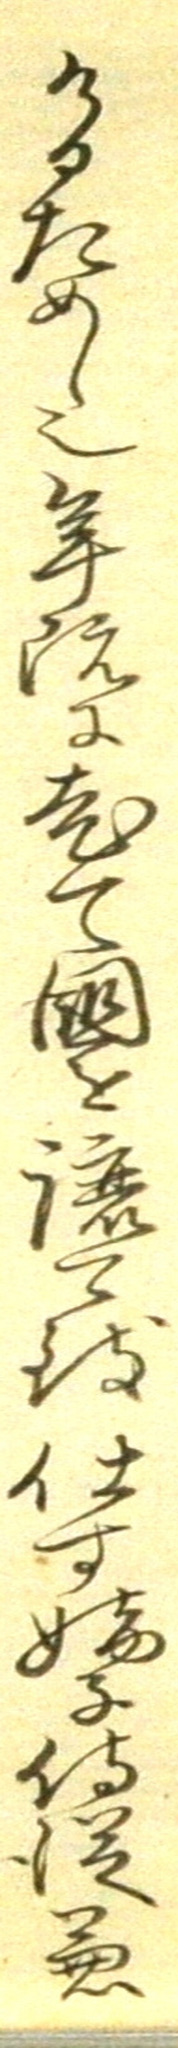けるためし也年既に老て国を譲て致仕す嫡子侍従兼
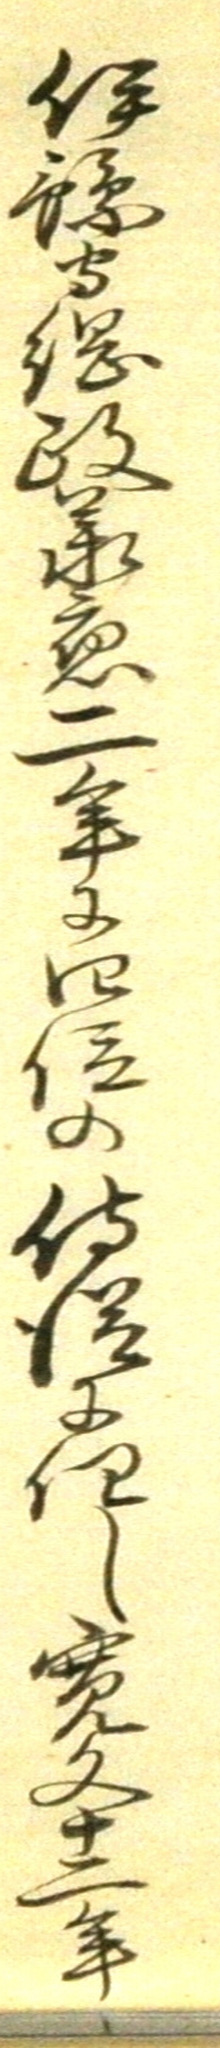伊予守綱政承応二年に四位の侍従に任し寛文十二年

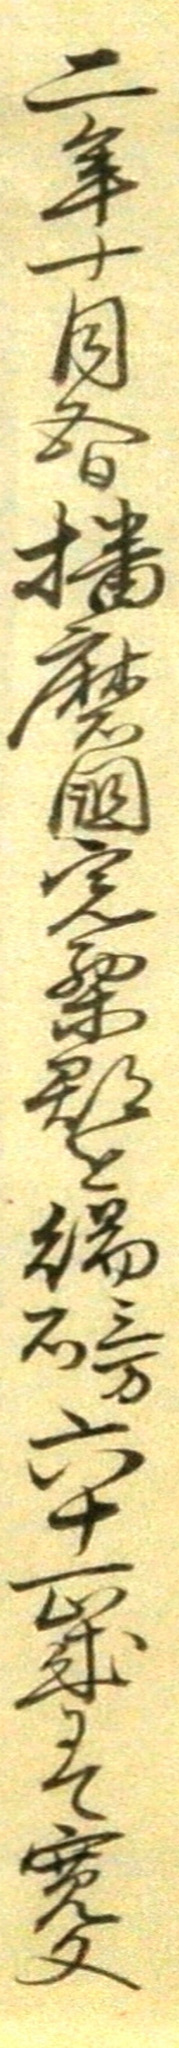二年十月五日播磨国宍粟郡を賜三万石六十一歳にて寛文
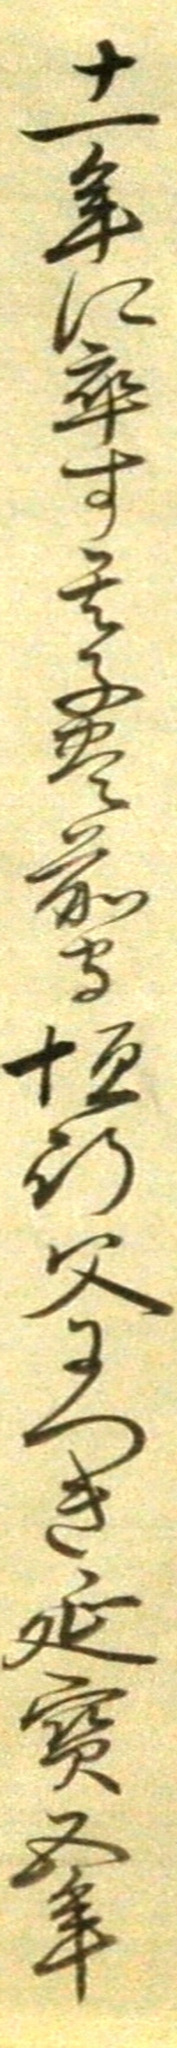十一年に卒す其子豊前守恒行父につき延宝五年
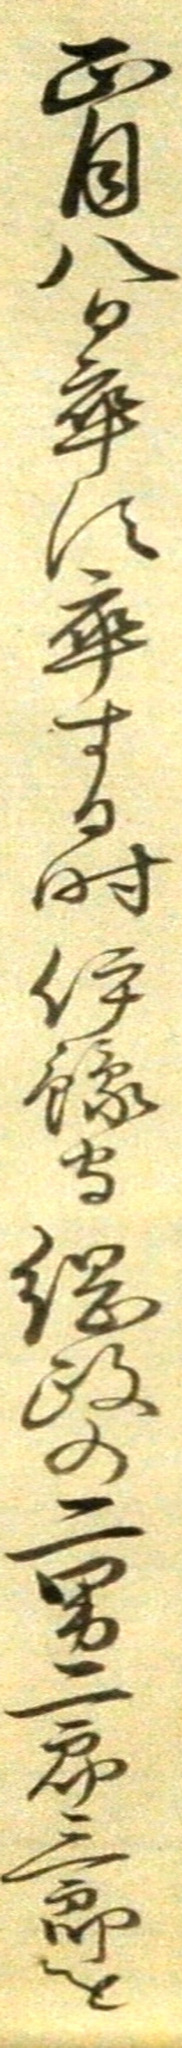正月八日卒す卒する時伊予守綱政の二男二郎三郎を
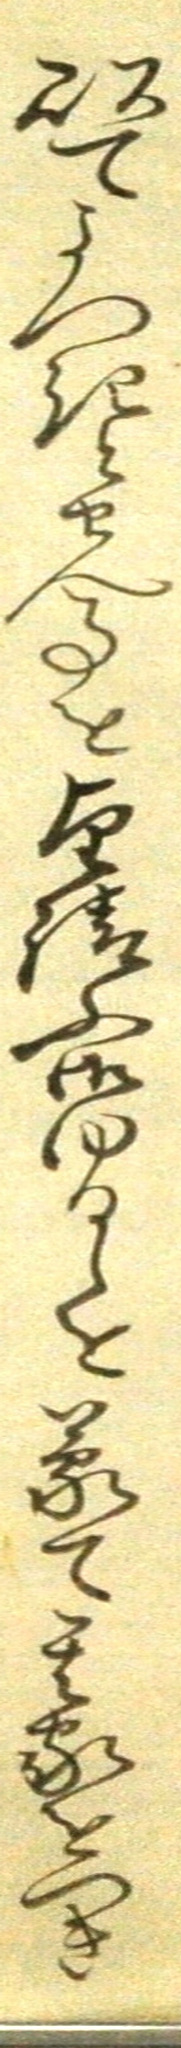以てよつきとせん事を望請ふ御ゆるしを蒙て其家をつき
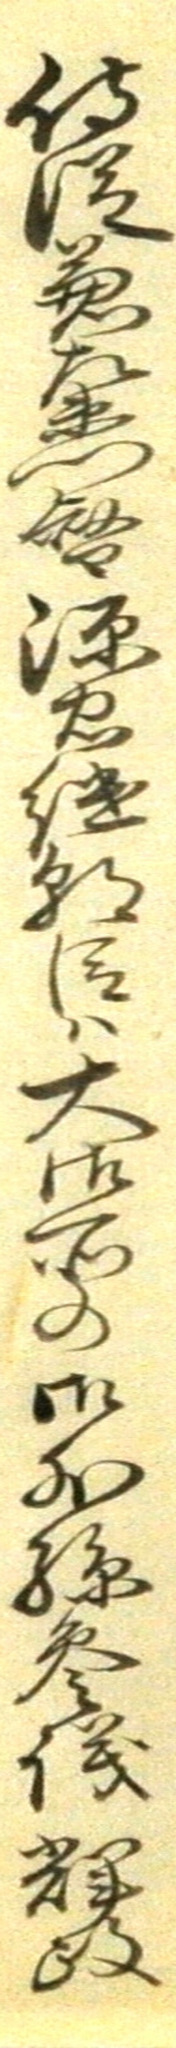侍従兼左衛門督源忠継朝臣は大御所の御外孫参議輝政
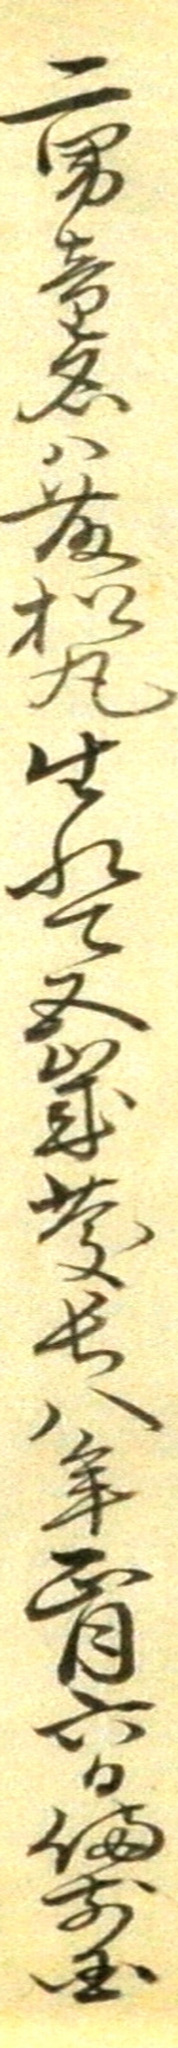二男童名は藤松丸生れて五歳慶長八年正月六日備前国
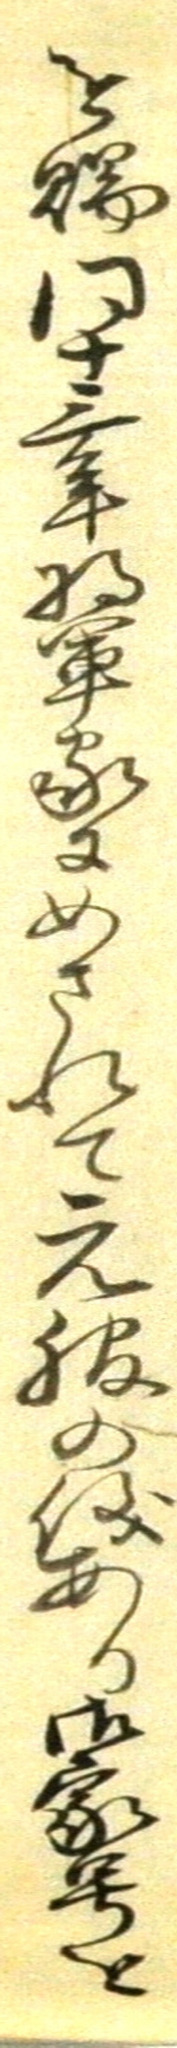を賜同十三年将軍家にめされて元服の儀あり御家号を
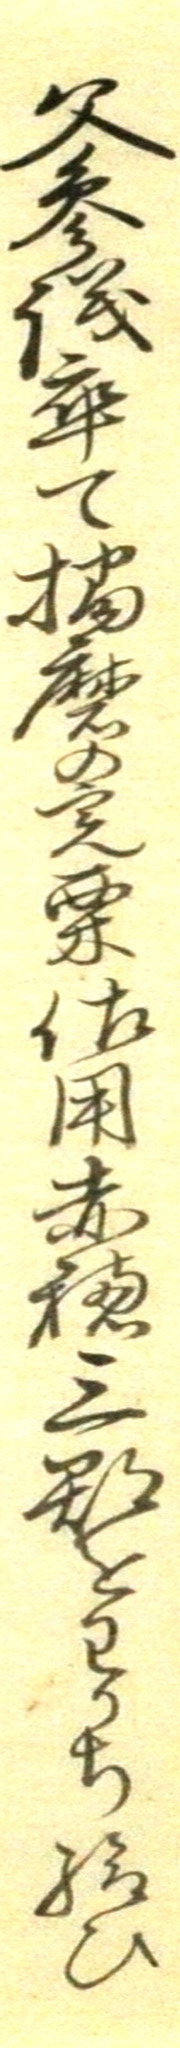父参議卒て播磨の宍粟佐用赤穂三郡をわかち給ひ
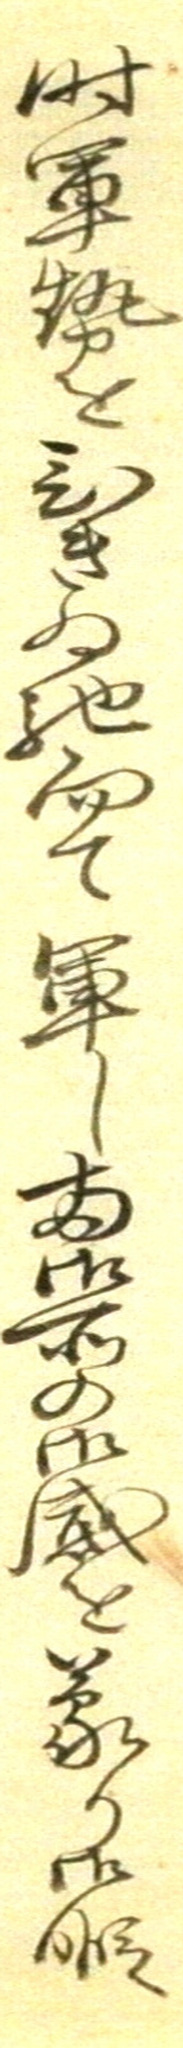時軍勢をひきゐ馳向て軍し両御所の御感を蒙り御暇
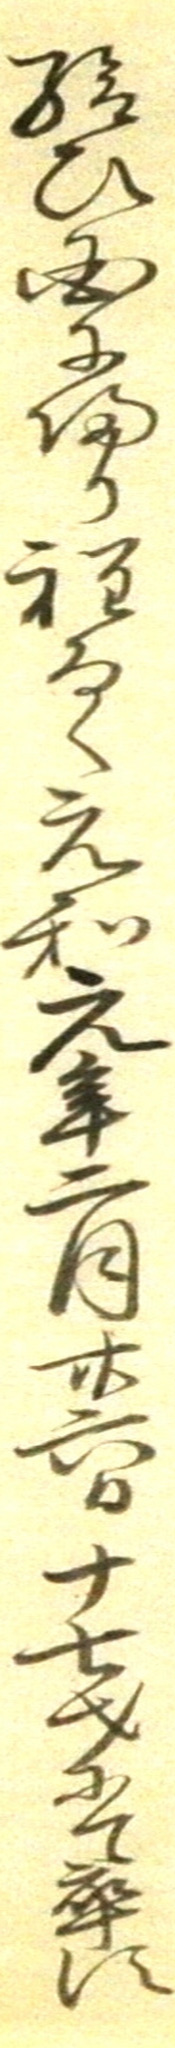給ひ国に帰り程なく元和元年二月廿六日十七才にて卒す
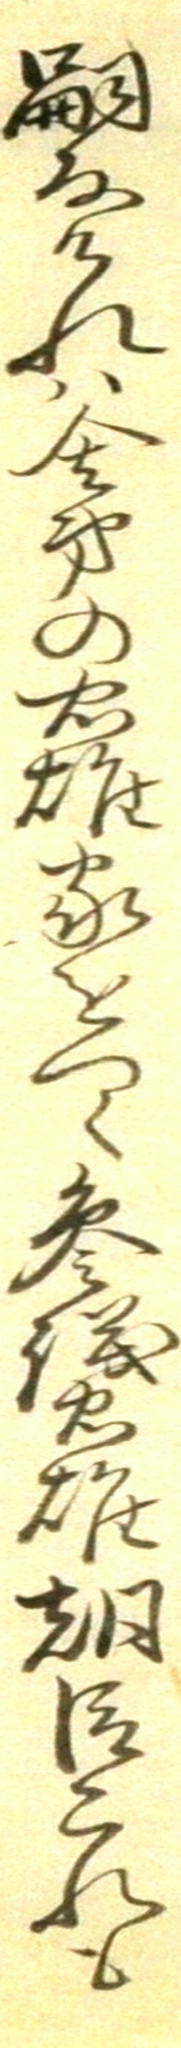嗣なけれは舎弟の忠雄家をつく参議忠雄朝臣これも
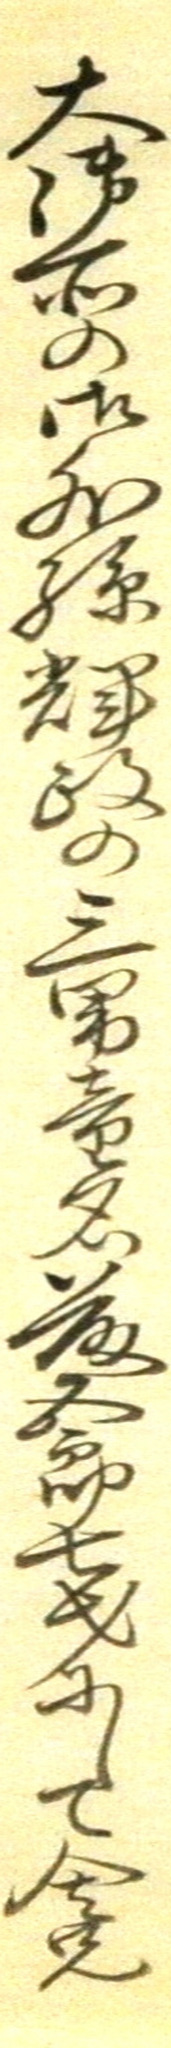大御所の御外孫輝政の三男童名藤五郎七才にして舎兄
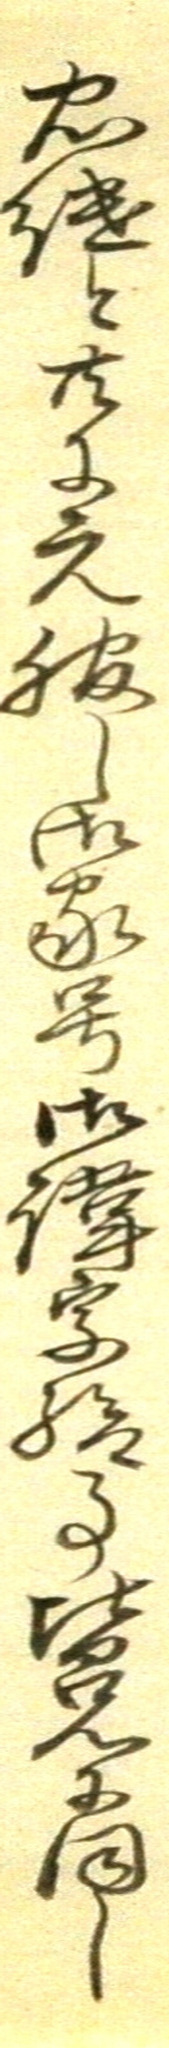忠継と共に元服し御家号御諱字給事皆兄に同し
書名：藩翰譜（七・上）
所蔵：伊那市立高遠町図書館・合同会社AMANE
